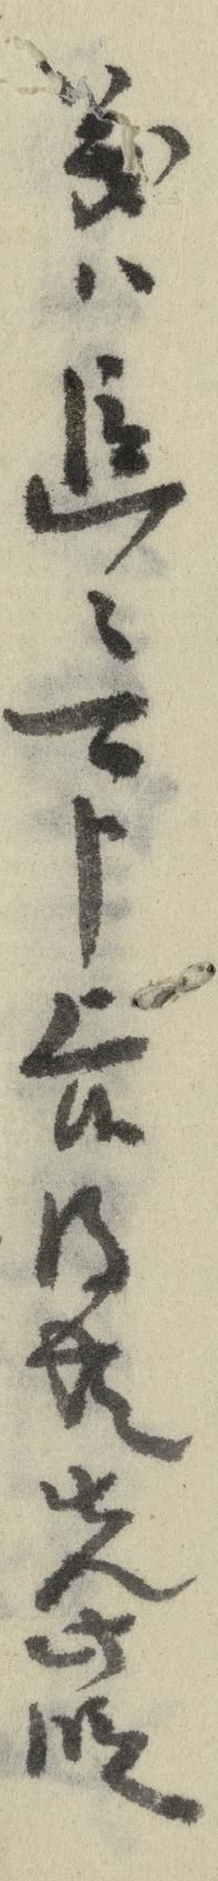義ハ追々可申上候得共先此段
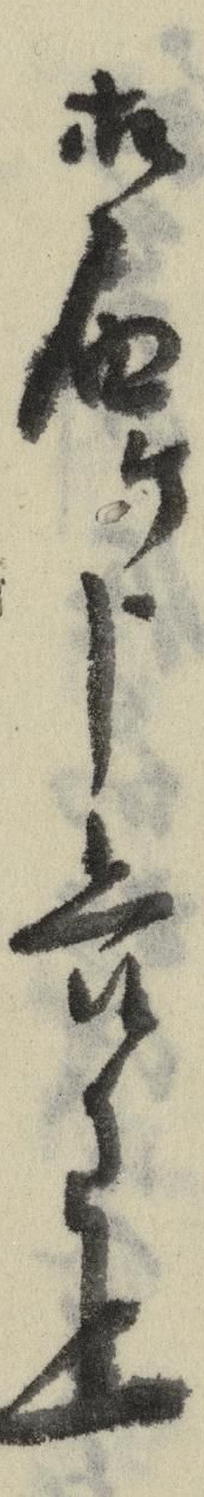御届申上候以上

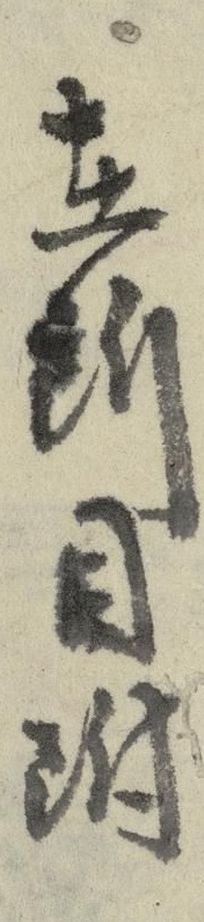在所日附
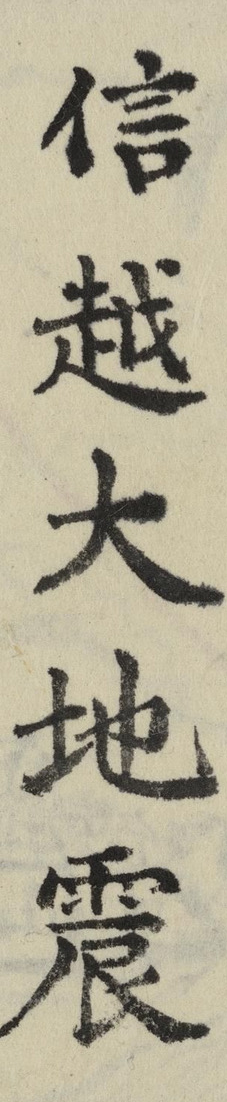信越大地震
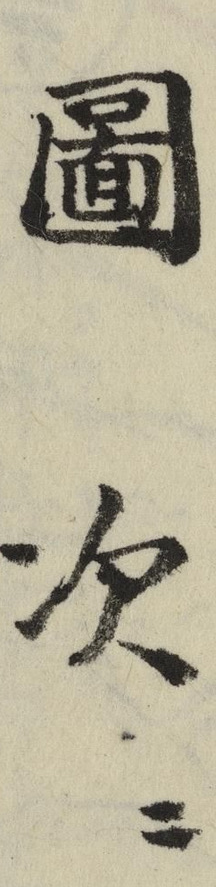図次二

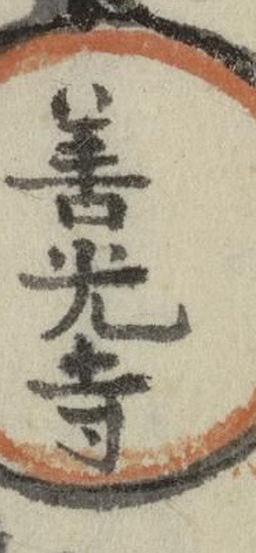善光寺
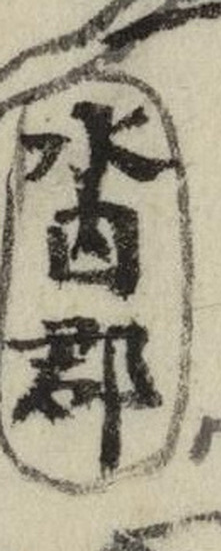水内郡

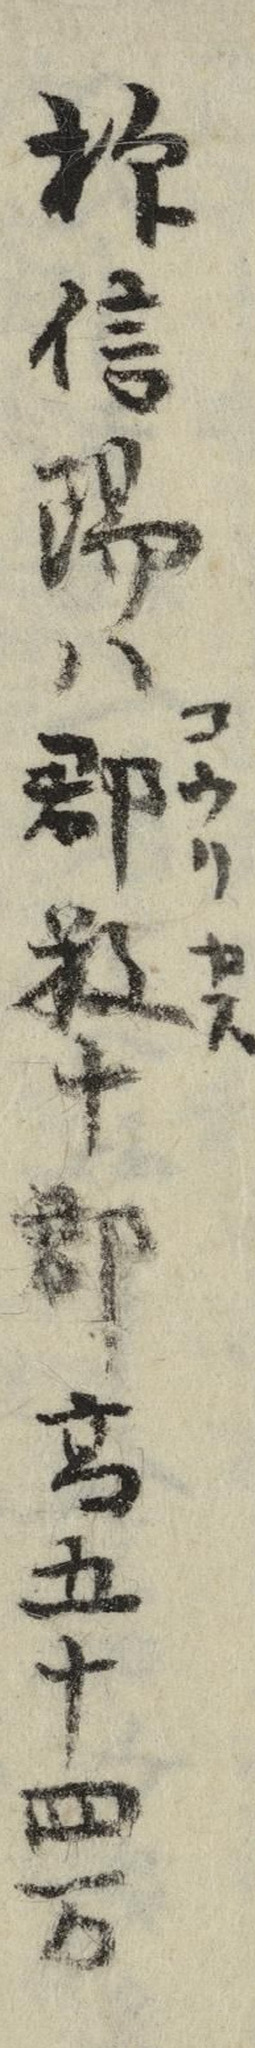抑信陽ハ郡数十郡高五十四万
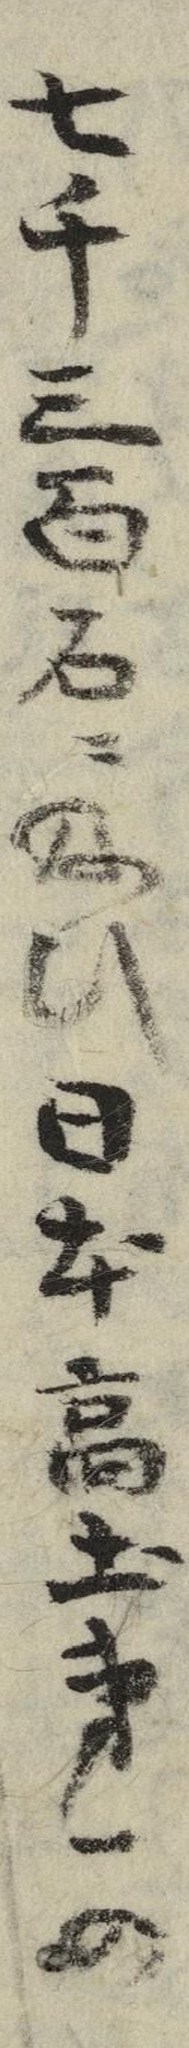七千三百石二及ひ日本高土第の
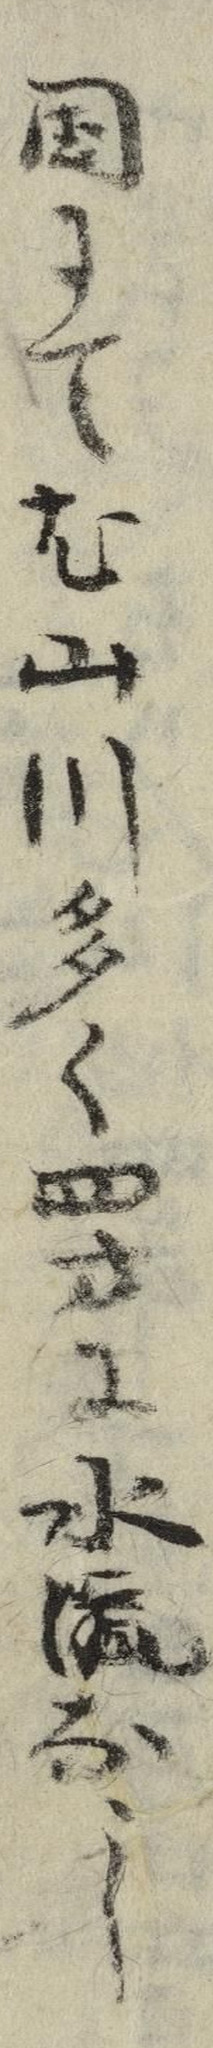国にて尤山川多く四方二水流なし
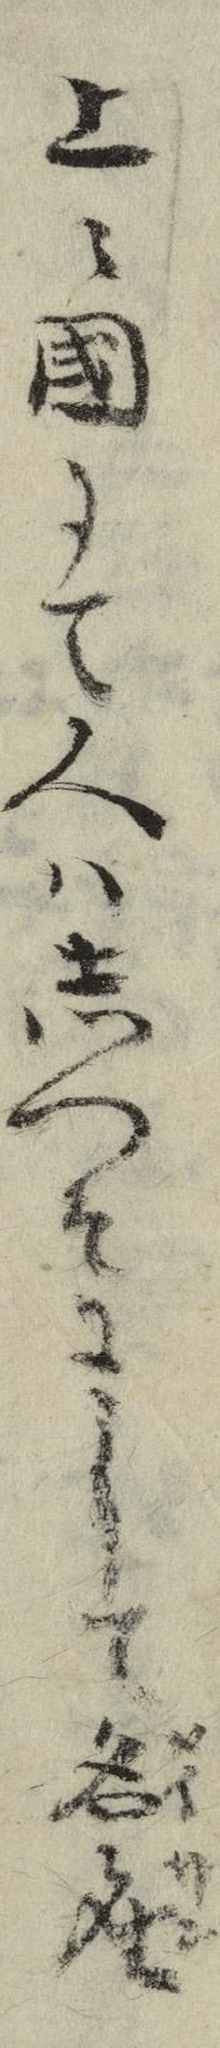上々国にて人ハしつそにして名産

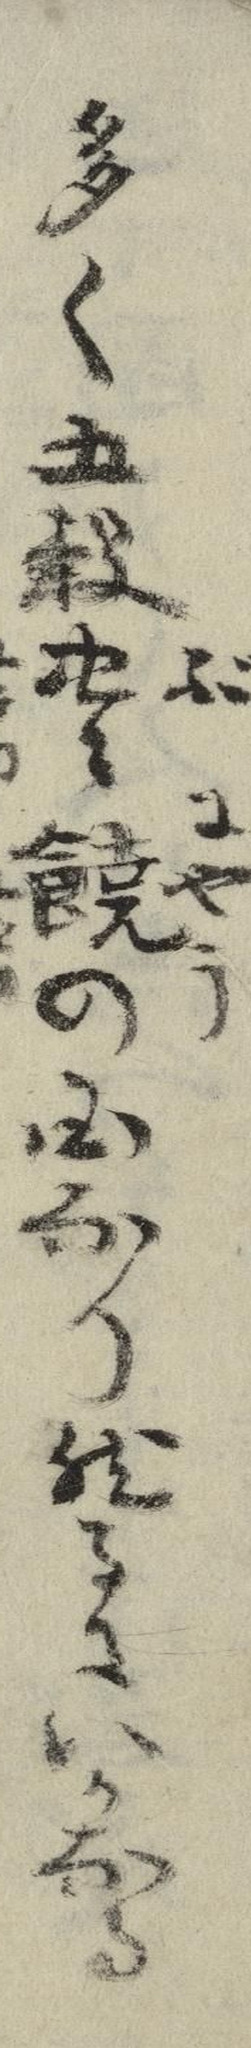多く五穀豊饒の国なり然るにいかなる
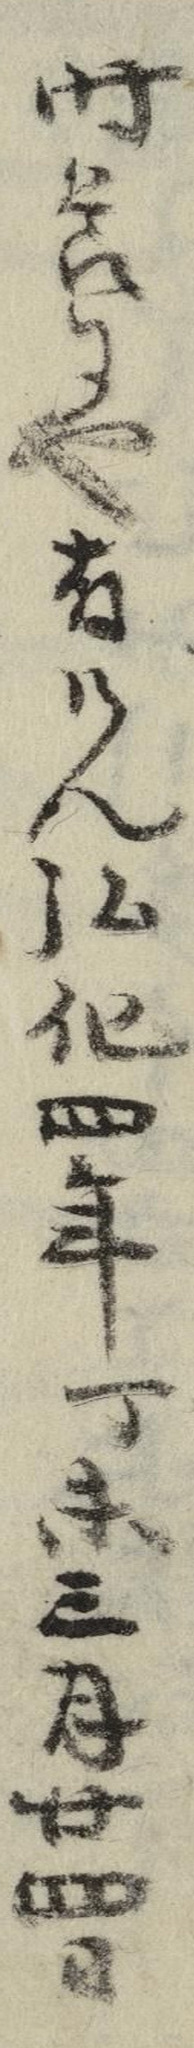時節にや有けん弘化四年丁未三月廿四日
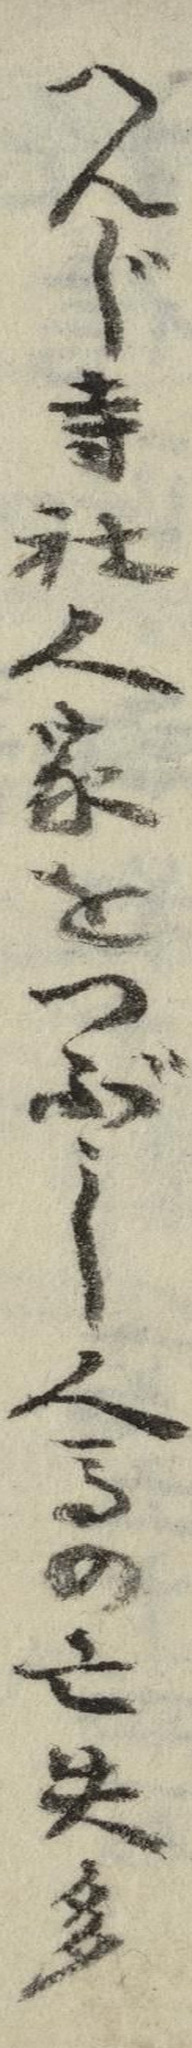へんじ寺社人家をつぶし人馬の亡失多
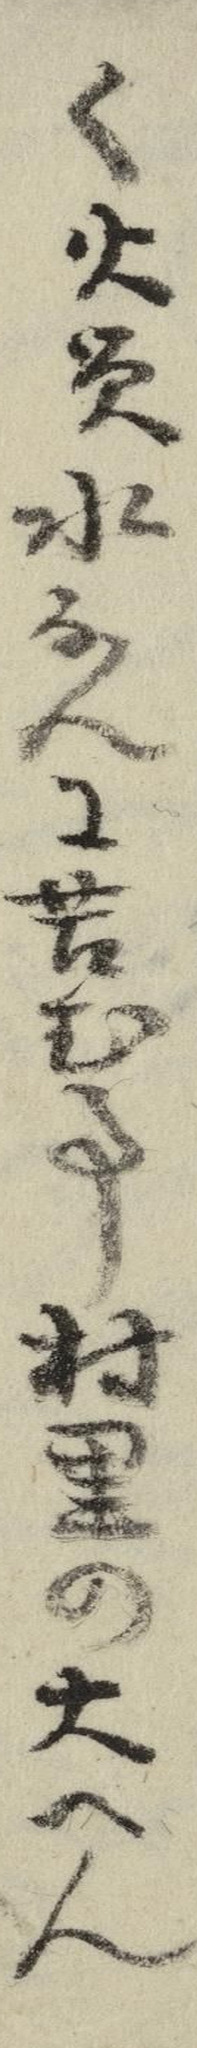く火災水なんに苦む事村里の大へん
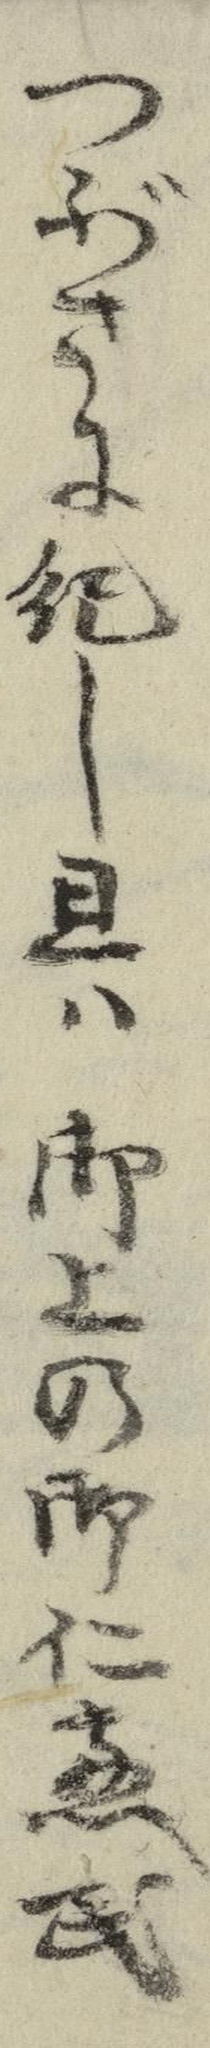つぶさに紀し且ハ御上の御仁恵民
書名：信州大地震一件之冩　丁未弘化四年三月吉日
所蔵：東京大学地震研究所図書室 Earthquake Research Institute Library, The University of Tokyo, JAPAN
